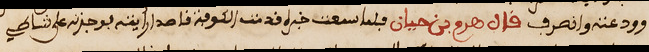وودعنه وانصرف قال هرم بن حيان فلما سمعت خبره قدمت الكوفة فاصدا رأيته فوجدته على شاطي
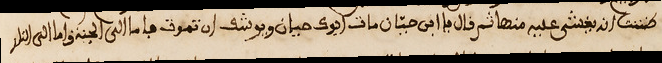ظننت انه يغشى عليه منها ثم قال يا ابن حيّان مات ابوك حيان ويوشك ان تمووت فاما الى الجنة واما الى النار
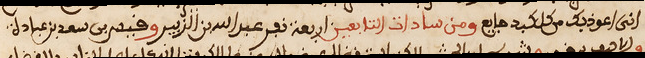انى اعوذ بك من كل كبد جايع ومن سادات التابعين اربعة نفر عبد الله بن الزبير وقيس بن سعد بن عبادة
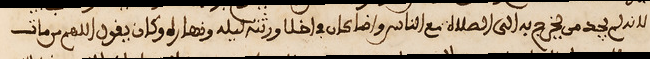لانه لم يجد من يخرج به الى الصلاة مع الناس وانما كان في اخلاف رثته ليله ونهاره وكان يقول اللهم من مات
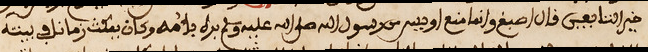خير التابعين قال اصبغ وانما منع اويس من رسول الله صلى الله عليه وسلم بره بأمه وكان يمكث زمانا في بيته
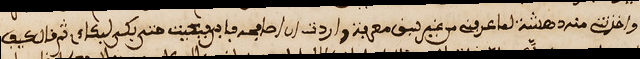واخذتنى منه دهشة لما عرفنى من غير سبق معرفة واردت ان اصافحه فبابن فبكيت حتى بكى لبكاءى ثم فان كيف
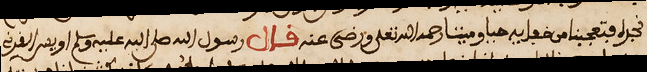نجده فتعجبنا من خفايه وميتا رحمه الله تعلى ورضى عنه قال رسول الله صلى الله عليه وسلم اويس القرنى
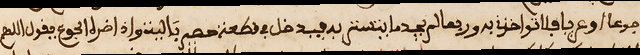جوعا او عريا فلا تواخذنى به وربما لم يجد ما يتستر به فيدخل في قطعة حصي بَالية واذا ضره الجوع يقول اللهم
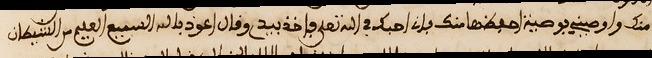منك واوصينى بوصية حفظها منك فانى اصبك في الله تعلى فاخذ بيدى وقال اعوذ بالله السميع العليم من الشيطان
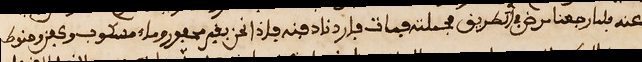عنه فلما رجعنا مرض في الطريق فحملنه فمات فاردنا دفنه فاذا نحن بقبر محفور وماء مسكوب وكفن وحنوط
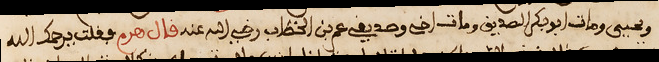ويحيى ومات ابو بكر الصديق ومات اخى وصديقى عمر بن الخطاب رضي الله عنه قال هرم فقلت يرحمك الله
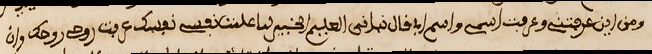ومن اين عرفتنى وعرفت اسمى واسم ابى قال انبانى العليم الخبير لما علمت نفسىي نفسك عرفت روحى روحك وان
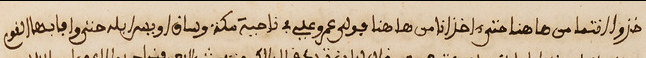خزوا انتما من هاهنا حتى اخذ انا من هاهنا فولى عمر وعلي في ناحية مكة وساق اويس ابله حتى وافا بها القوم
